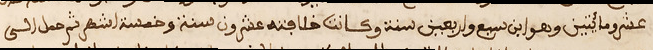عشر ومايتين وهو ابن سبع واربعين سنة وكانت خلافته عشرون سنة وخمسة اشهر ثم حمل الى
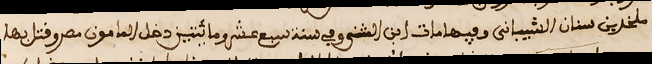ملخد بن سنان الشيبانى وفيها مات ابن المثنى في سنة سبع عشر ومايتين دخل المامون مصر وقتل بها
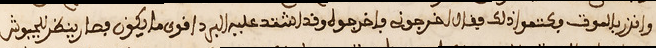وانذر بالموت فكتموا ذلك فقال اخرجونى فاخرجوه وقد اشتد عليه البردا قوى ما يكون فصار ينظر للجيوش
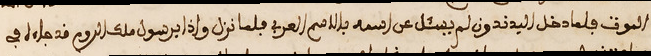الموت فلما دخل البدندون لم يسئل عن اسمه بالاسم العربى فلما نزل واذا برسول ملك الروم قد جاءه في
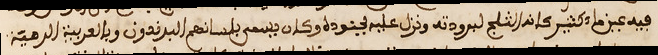فيه عين ماء كثير كانه الثلج لبرودته ونزل عليه بجنوده وكان يسمى بلسانهم البرندون وبالعربية الرمية
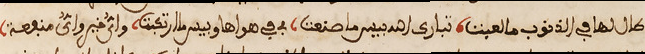طال لها في الذنوب ما لعبت تبارك الله بيس ما صنعت في في هو اها وبيس ما ارتكبت واى خير واى منفعة
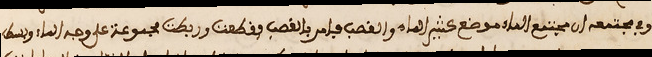وفي مجتمعه ان مجتمع الماء موضع كثير الماء والقصب فامر بالقصب فقطعت وربطت مجموعة على وجه الماء وبسط
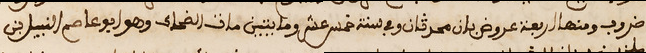ضروف ومنها اربعة عروض بان محدثان وفي سنة خمس عشر ومايتين مات الضحاك وهو ابو عاصم النبيل بن
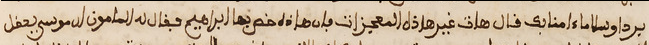بردا وسلاما ءامنا بك قال هات غير هاذه المعجزات فان هاذه خصر بها ابراهيم فقال له المامون ان موسى يدخل
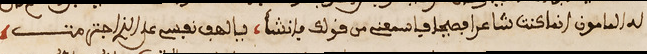له المامون انما كنت شاعرا فصيحا فاسمعنى من قولك فانشأ يا لهف نفسى على الذي اجترمت
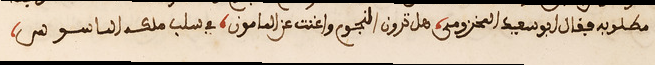مطلوبه فقال ابو سعيد المخزومى هل ترون النجوم واغنت عن المامون في سلب ملكه الماسوس
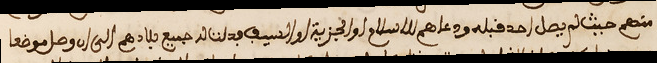منهم حيث لم يصل احد قبله ودعاهم للاسلام او الجزية او السيف فدلت له جميع بلادهم الى ان وصل موضعا
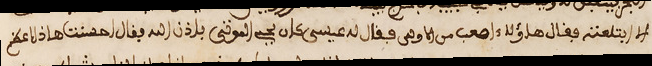الا ابتلعته فقال هلؤلاء اصعب من الاولى فقال له عيسى كان يحيى الموتى باذن الله فقال احسنت هاذه اعظم
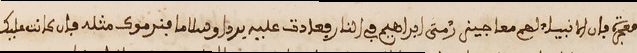معجرة فان الانبياء لهم معاجيز رمى ابراهيم في النار فعادت عليه بردا وسلاما فنرموك مثله فان كانت عليك
